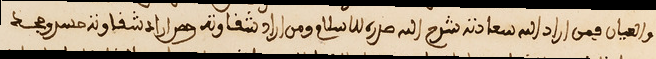والعيان فمن اراد الله سعادته شرح الله صدره للاسلام ومن اراد شقاوته رحص اراد شقاوته حسد ومجد
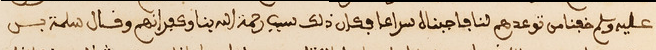عليه وسلم خفنا من توعدهم لنا فاجبناه سراعا فكان ذلك سبب رحمة الله بنا وكفدانهم وقال سلمة بن
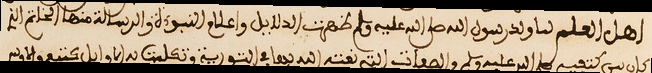اهل العلم لما ولد رسول الله صلى الله عليه وسلم ظهرت الدلايل واعلام النبوءة والرسالة منها الخاتم الذي
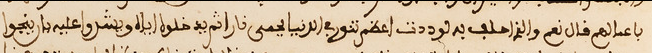باعمالهم قال نعم والذي حلف به لوددت اعظم تنور في الدنيا يحمى نارا ثم يد خلوه اياه ويشدوا عليه بان ينجوا
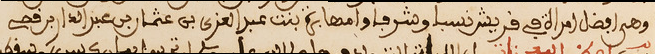وهي افضل امراة في قريش نسبا وشرفا وامها برة بنت عبد العزى بن عثمان بن عبد الدار بن قصى
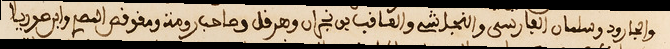والجارود وسلمان الفارسى والنجاشى والعاقب بن نجران وهرقل وصاحب دومة ومقوقص المصرى وابن صوريا
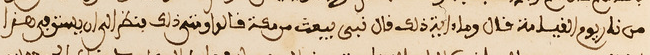من نار يوم القيامة قال وما ءاية ذلك قال نبى يبعث من مكة قالوا ومتى ذلك فنظر الى ان يستوفي هذا
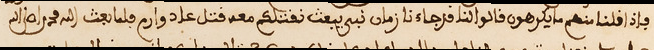فاذا قلنا منهم ما يكرهون قالوا لنا قد جاءنا زمان نبي يبعث نقتلكم معه قتل عاد وارم فلما بعث الله محمدا صلى الله
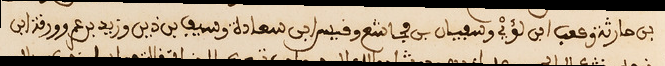بن حارثة وكعب ابن لؤي وسفيان بن فحاشع وقيس ابن سعادة وسيف بن ذين وزيد بن عمر وورقة ابن
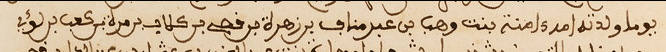يوما ولدته امد ءامنة بنت وهب بن عبد مناف بن قصى بن كلاب بن مرة بن كعب بن لؤي
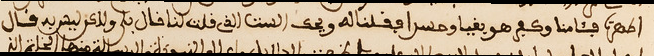اطهرت فئامنا وكفر هو بغيا وحسدا فقلنا له ويحك الست الذى قلت لنا قال بلى ولاكن ليس به قال
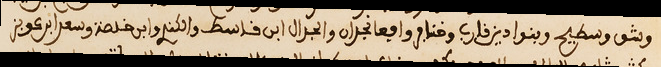وشق وسطيح وبنو ا دين قارب وخنافر وافعا نجدان والجدال ابن قاسط والكنرى وابن خلصة وسعد ابن كوبز
